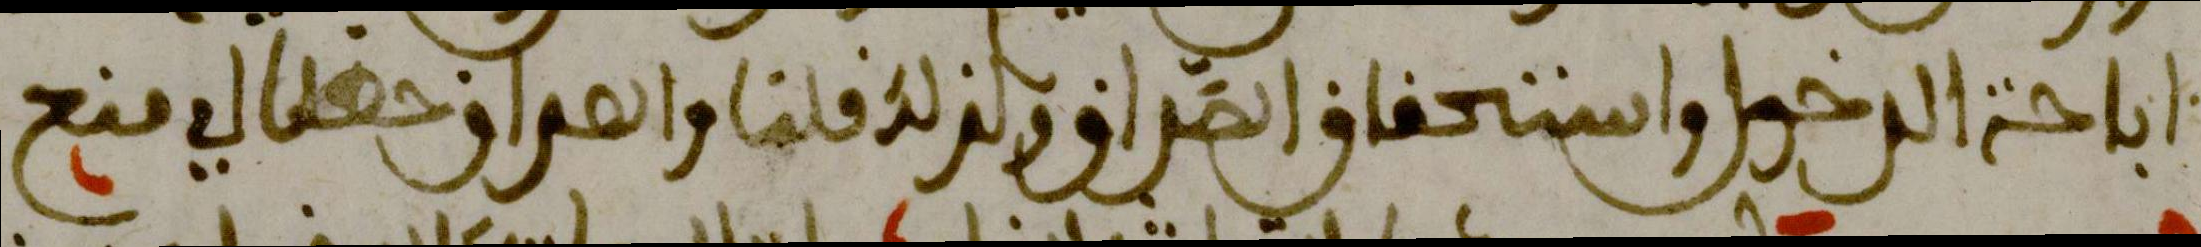اباحة الدخول و استحقاق الصّداق و لذلك فانما و الصداق حظلا اي منع
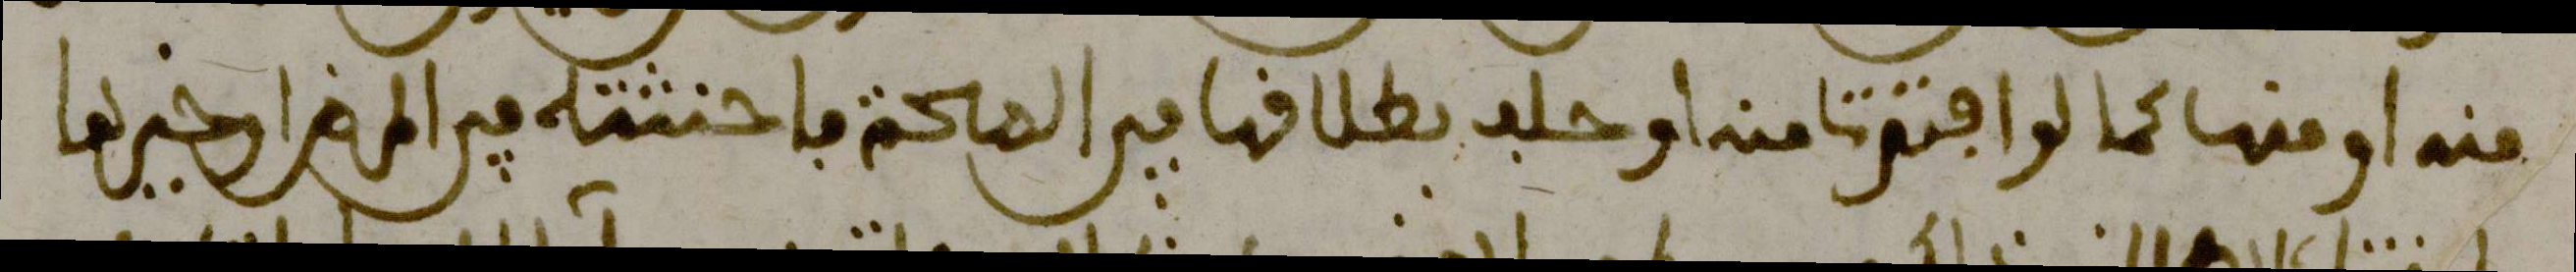منه او منهما كما لو افتدت منه او حلف بطلاقها في الصحة احنثته في المرض و خيرها
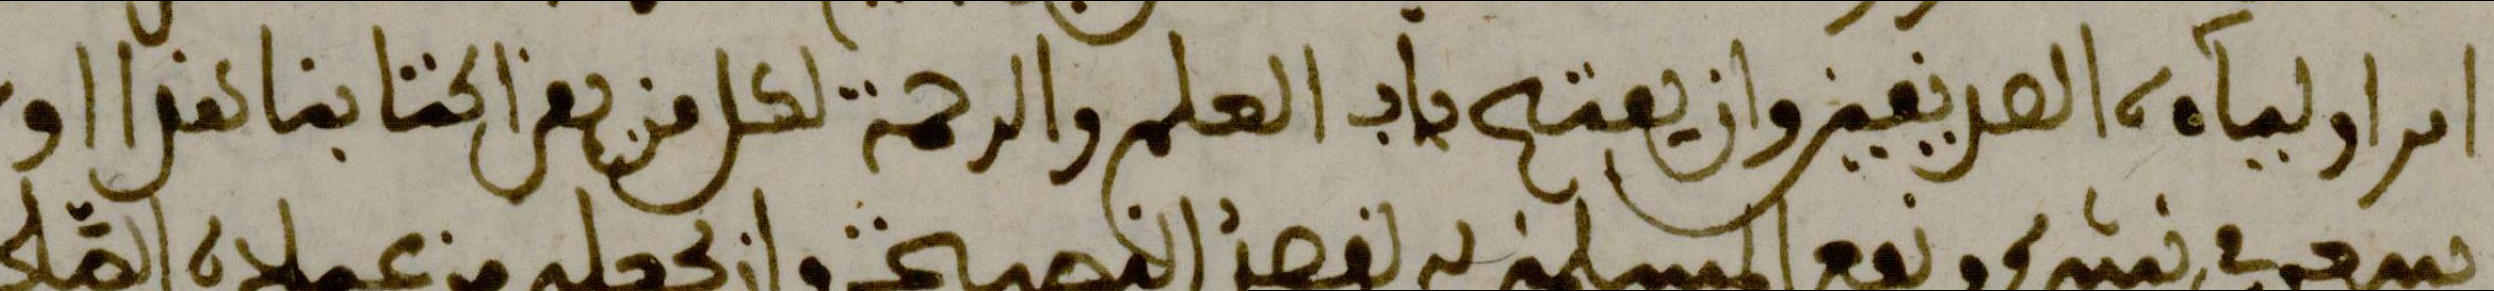امر اولياءه الصديقين و ان يفتح باب العلم و الرحمة لكل من يقرا كتابنا هذا او
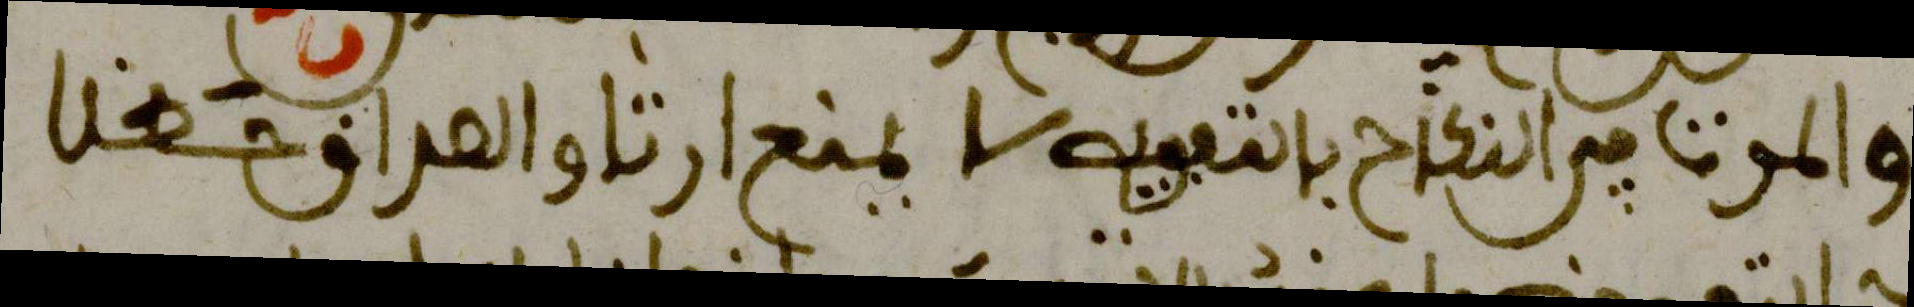و الموت في النكاح بالتفويض لا يمنع ارثا و الصداق و حظلا
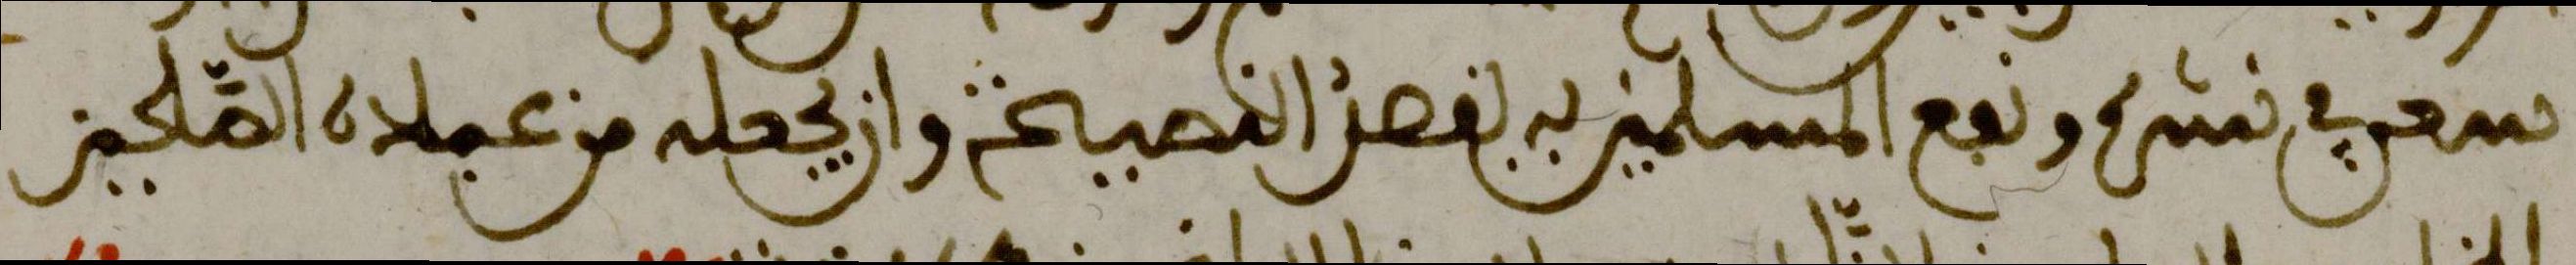سعى في نشره و نفع المسلمين به بقصد النصيحة و ان يجعله من عباده الصّلحين
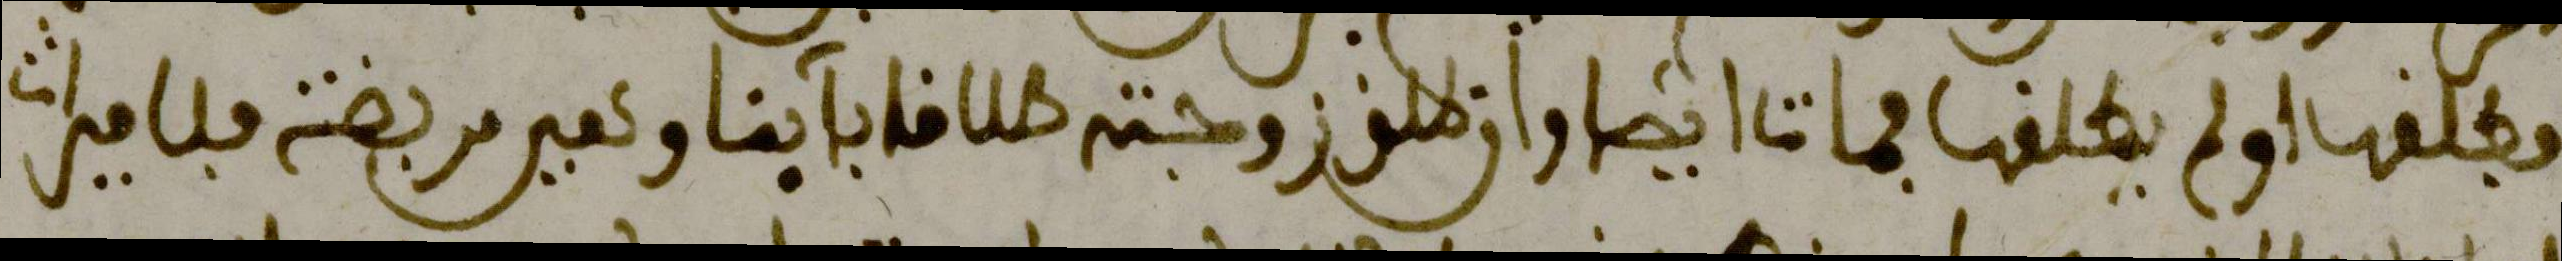فطلقها او لم يطلقها فماتا ايضا و ان طلق زوجته طلاقا بائنا و هي مريضة فلا ميراث
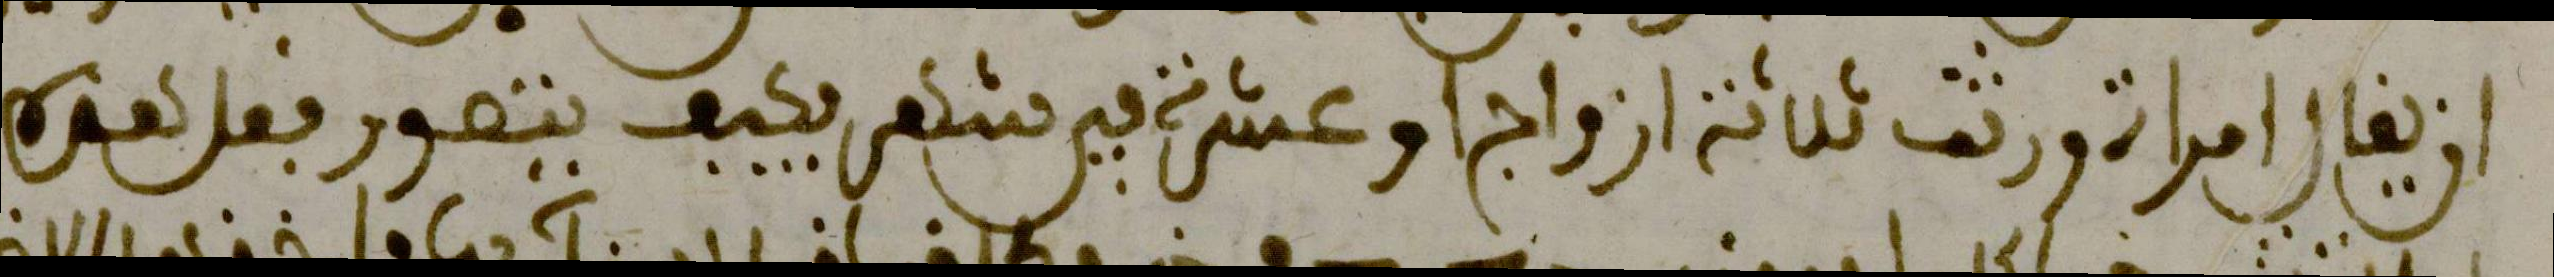ان يقال امراة ورثت ثلاثة ازواج او عشرة في شعر فكيف يتصور فقل هذه
